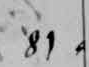81
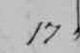17
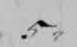5
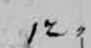12
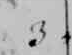3
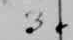3
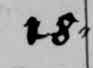18
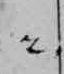2
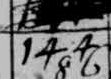144
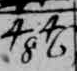86
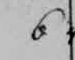6
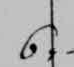6
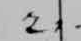2
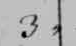3
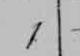1
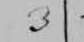3
